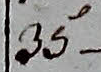35
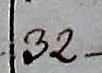32
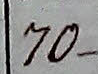70
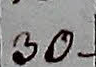30
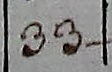33
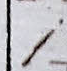1
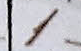1
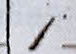1
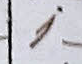1
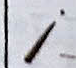1
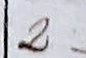2
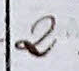2
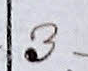3
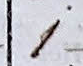1
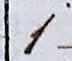1
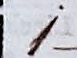1
